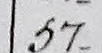57
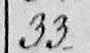33
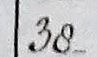38
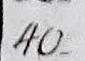40
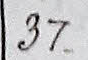37
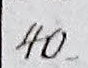40
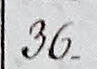36
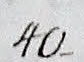40
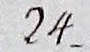24
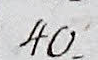40
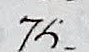75
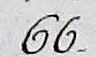66
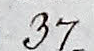37
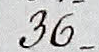36
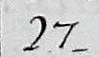27
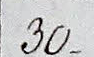30
